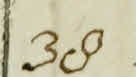38
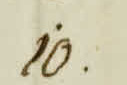10.
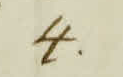4.
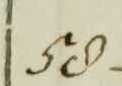58
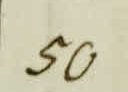50
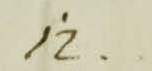12.
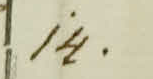14.
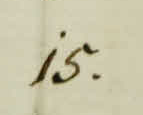15.
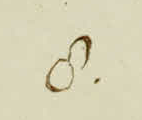8.
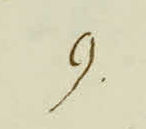9.
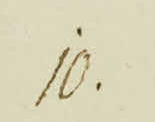10.
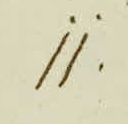11.
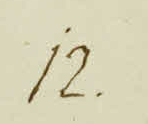12.
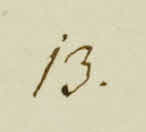13.
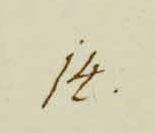14.
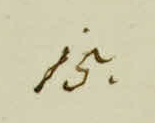15.
